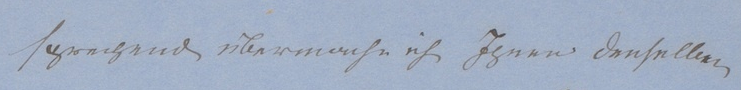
sprechend übermache ich Ihnen denselben
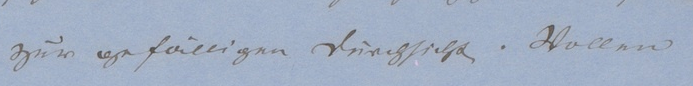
zur gefälligen Durchsicht. Wollen
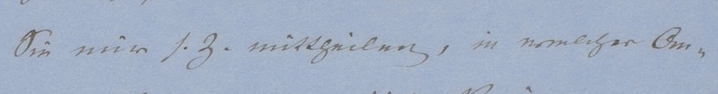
Sie mir s. Z. mittheilen, in welcher An-
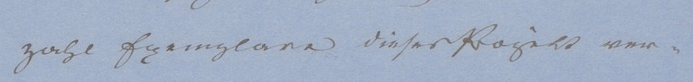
zahl Exemplare dieses Projekt ver-
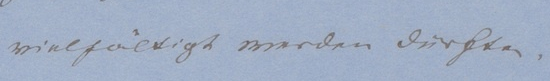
vielfältigt werden dürfte.
